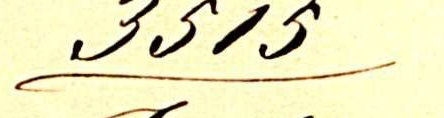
3315
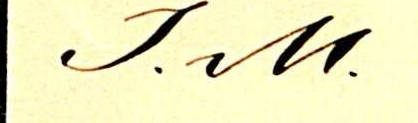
J. M.
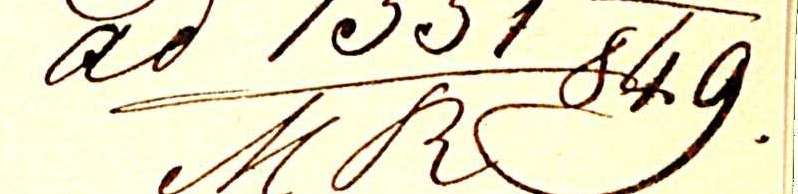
ad 1351 849.
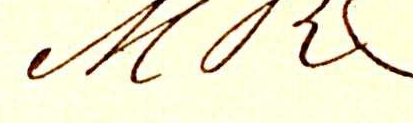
MR
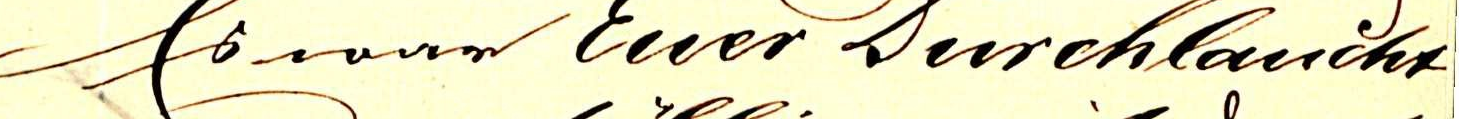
Es war Euer Durchlaucht
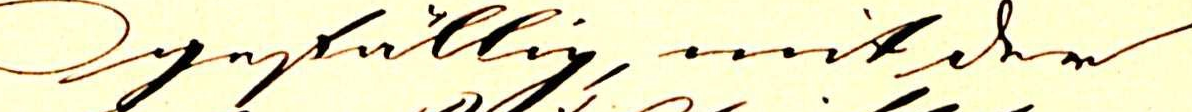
gefällig, mit der
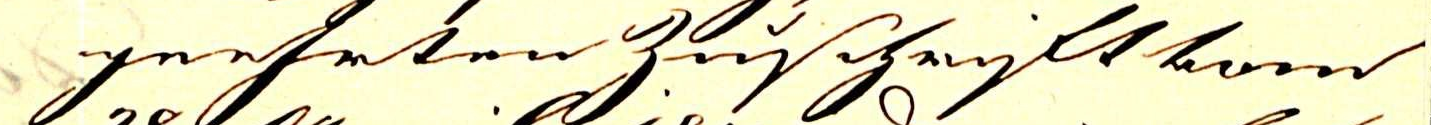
geehrten Zuschrift vom
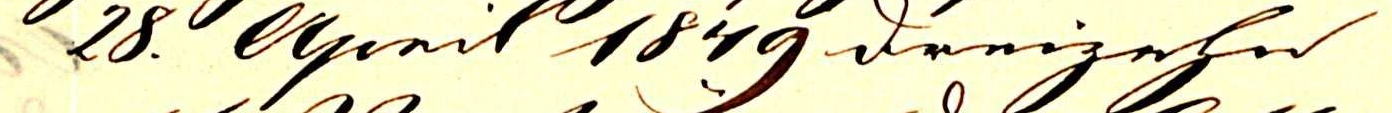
28. April 1849 dreizehn
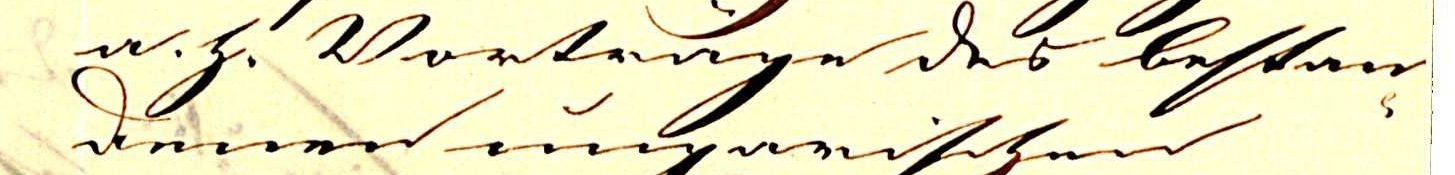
a. h. Vorträge des bestan¬
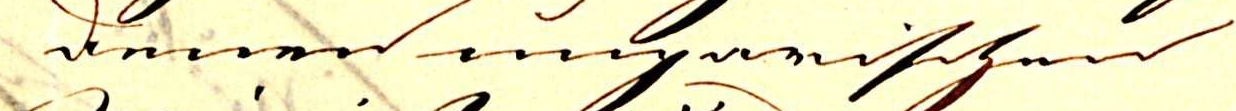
denen ungarischen
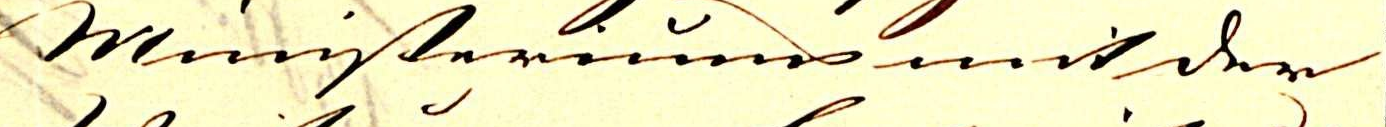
Ministeriums mit der
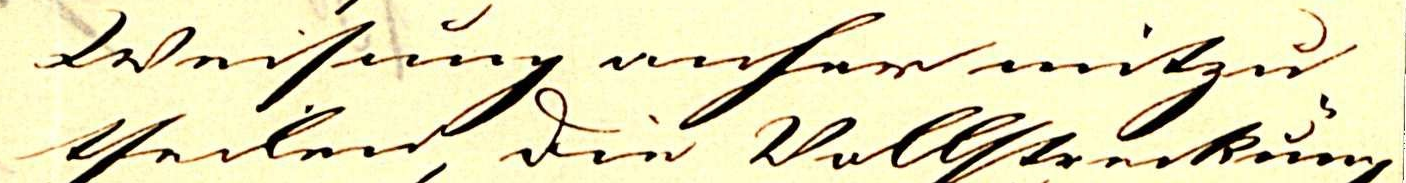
Weisung anher mitzu¬
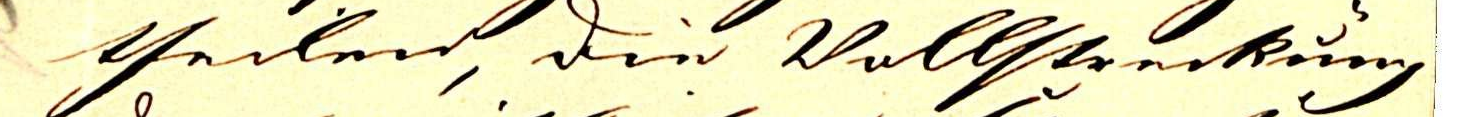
theilen, die Vollstreckung
